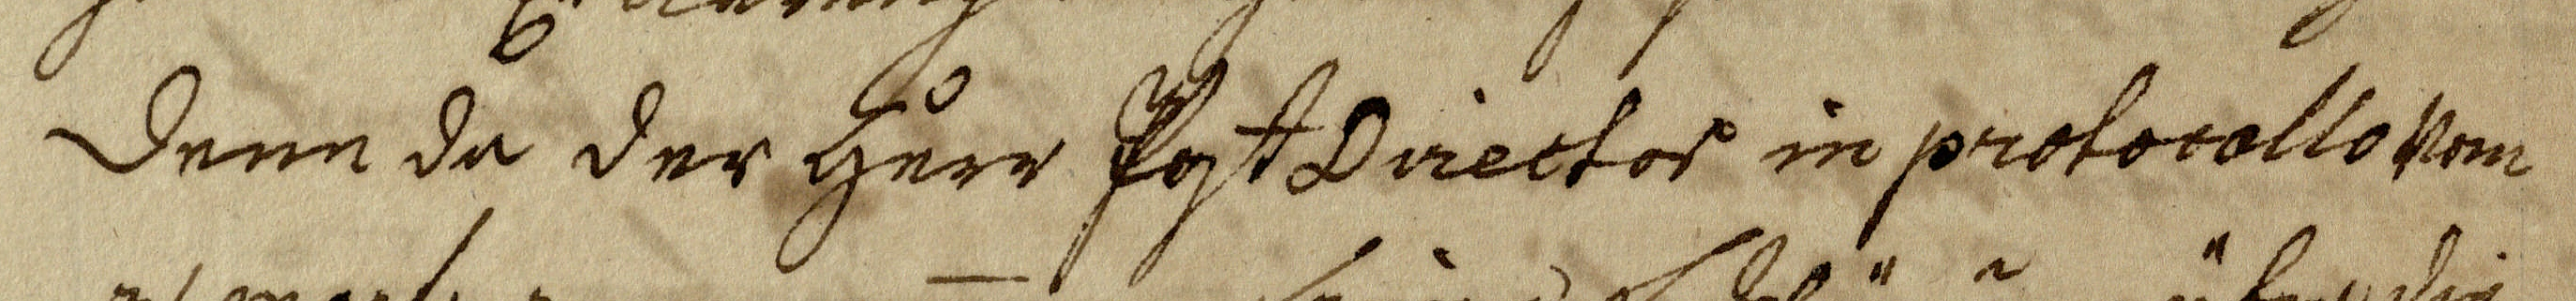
Denn da der Herr Post Director in protocollo vom
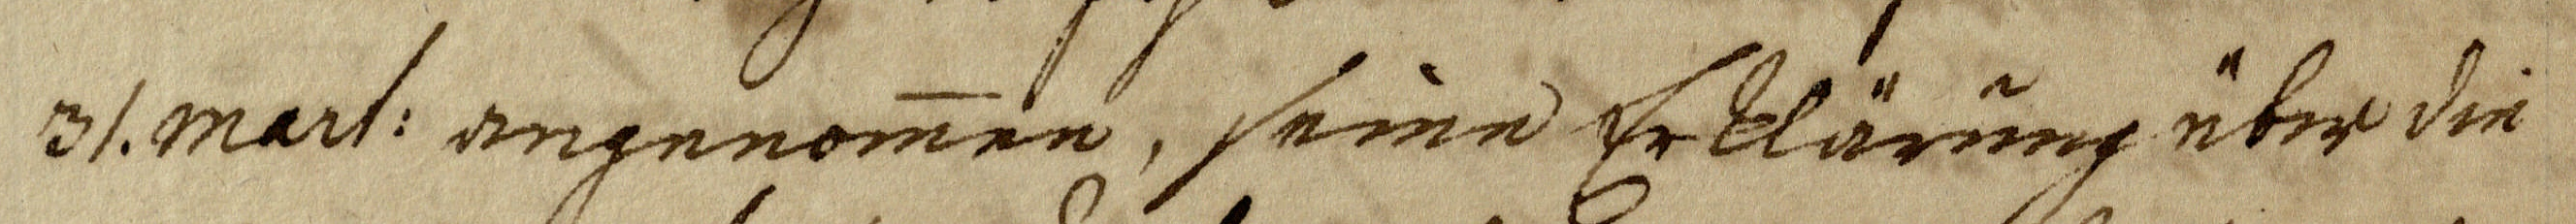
31. Mart angenomen, seine Erklärung über die
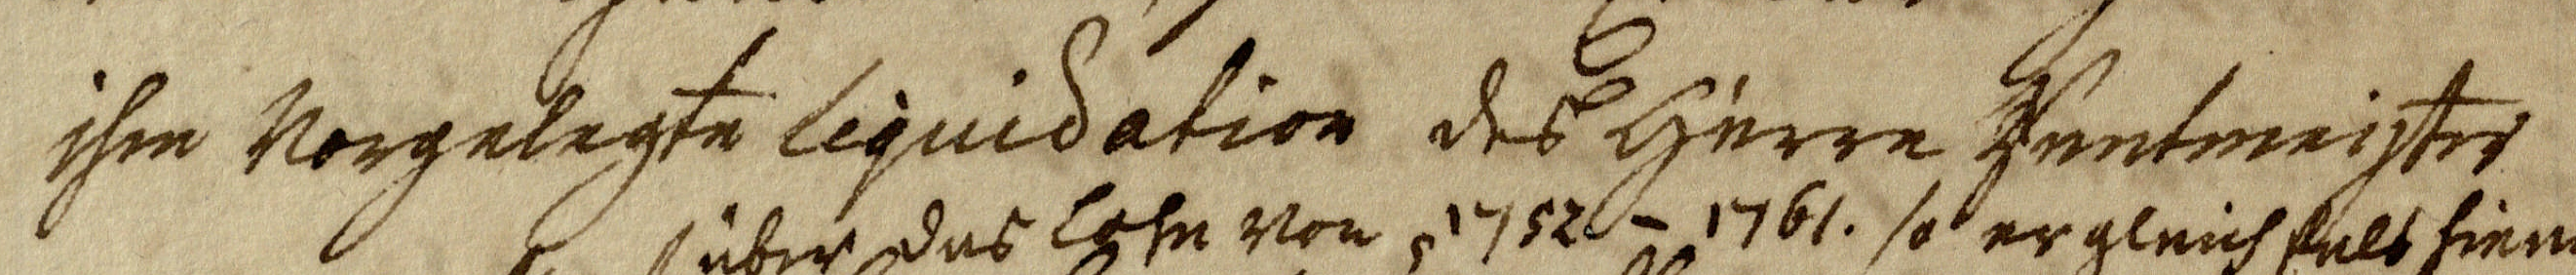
ihm vorgelegte liquidation des Herrn Rentmeister
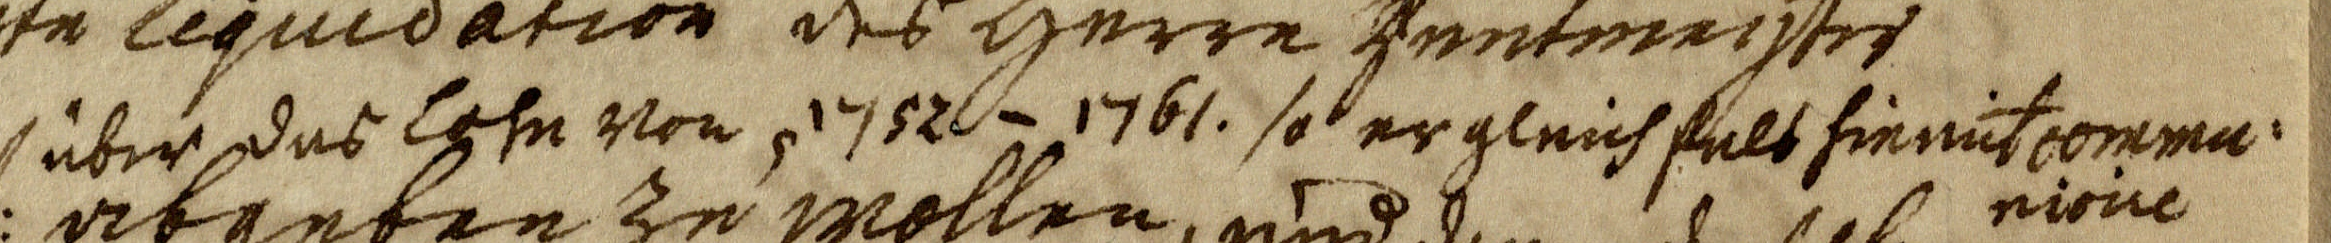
über das Lohn von 1752-1761. so er gleich fals hiemit commu¬
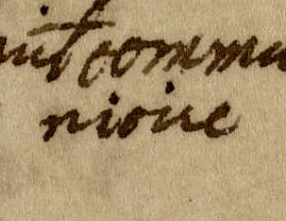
nicire
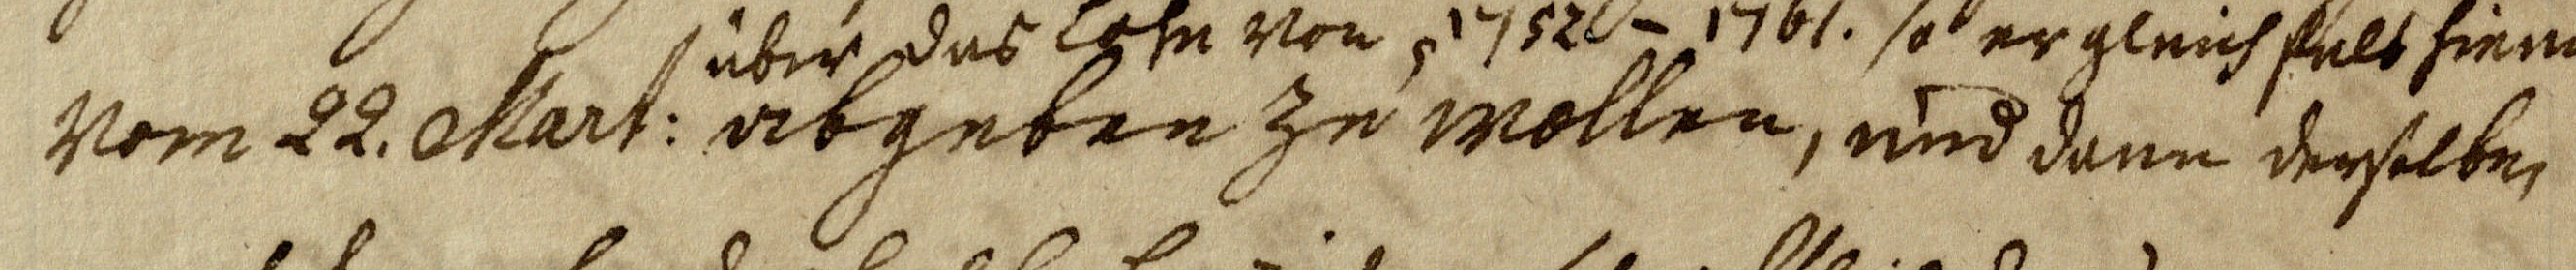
vom 22. Mart. abgeben zu wollen, und dann derselbe
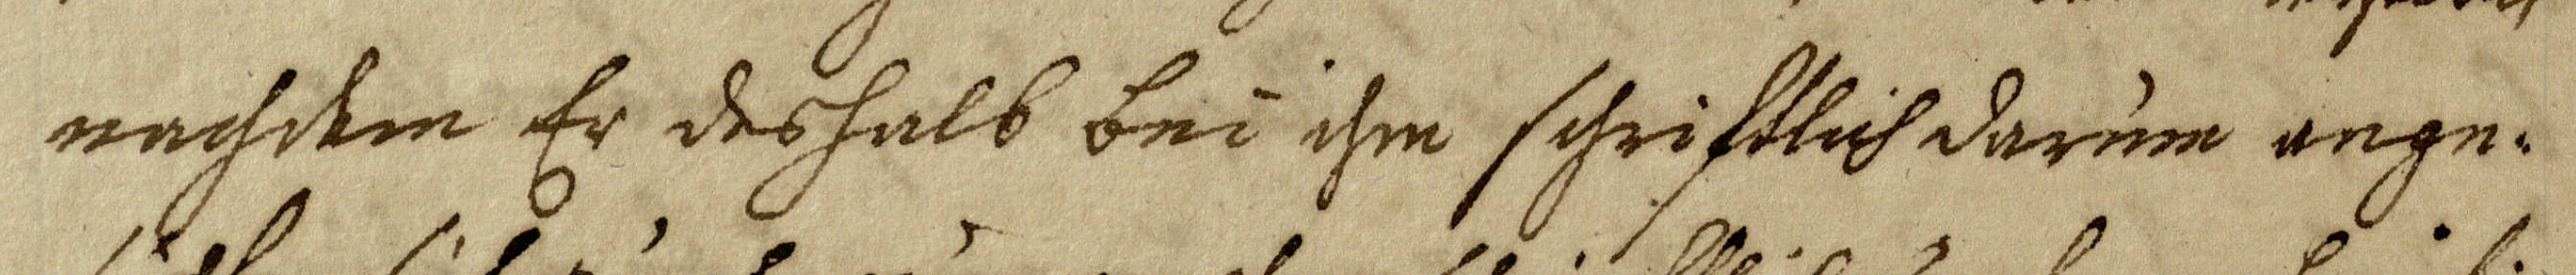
nachdem Er deshalb bei ihm schriftlich darum ange¬
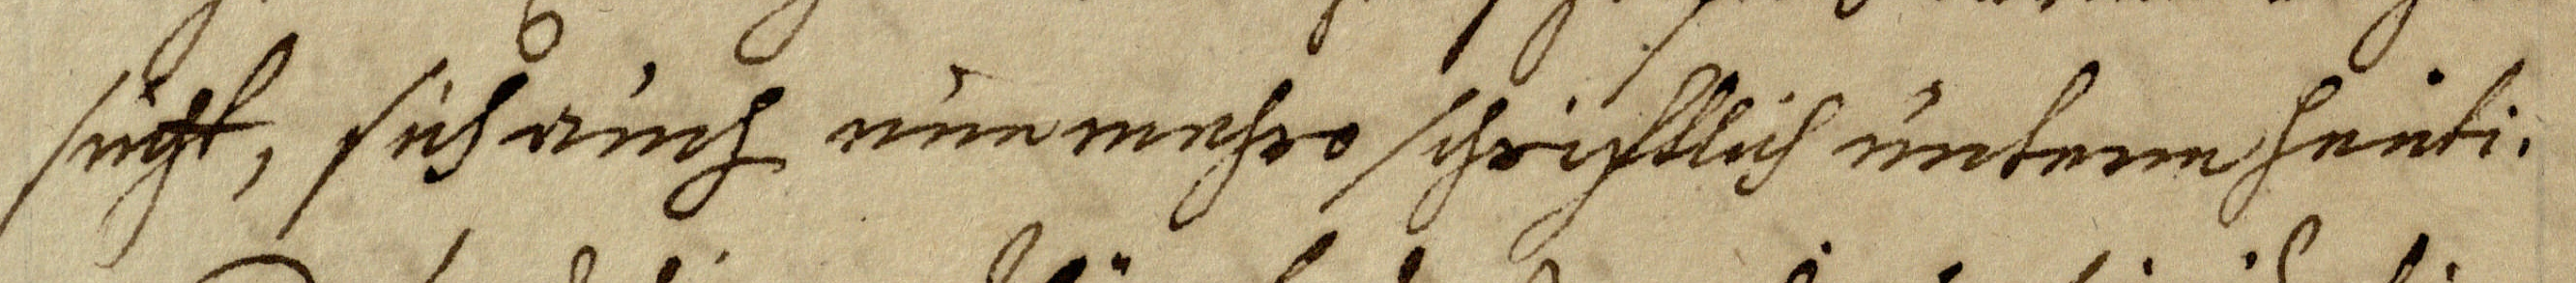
sucht, sich auch nunmehro schriftlich unterm heuti¬
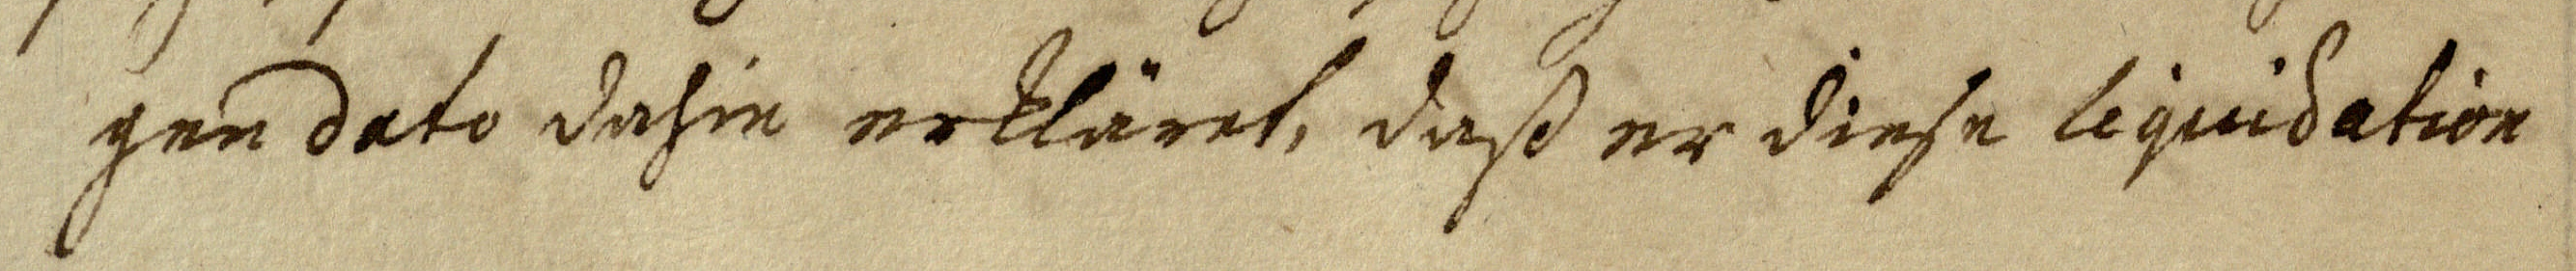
gen dato dahin erkläret, daß er diese liquidation
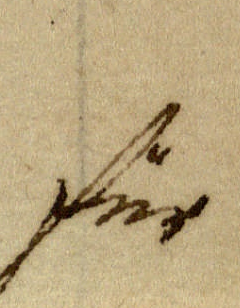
für
